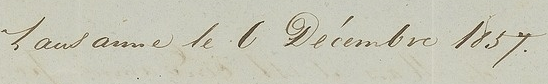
Lausanne, le 6 Décembre 1857.
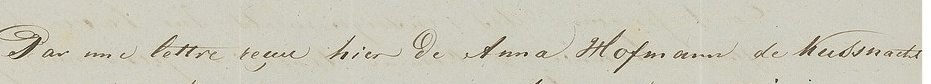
Par une lettre reçue hier de Anna Hofmann de Kussnacht
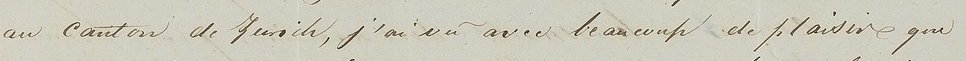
au canton de Zurich, j'ai lu avec beaucoup de plaisir que
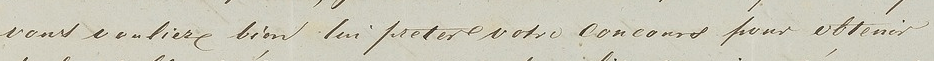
vous vouliez bien lui prêter votre concours pour obtenir
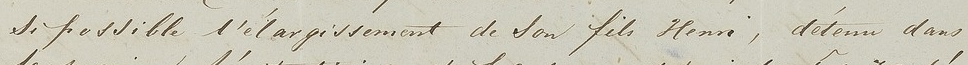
si possible l'élargissement de son fils Henri, détenu dans
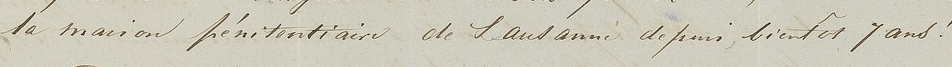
la maison pénitentiaire de Lausanne depuis bientôt 7 ans!
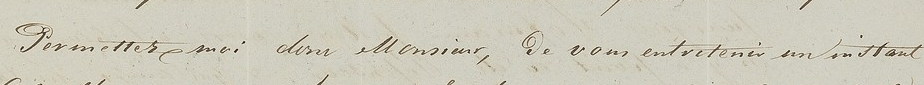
Permettez-moi donc Monsieur, de vous entretenir un instant
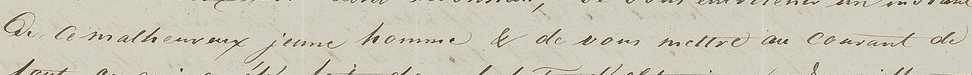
de ce malheureux jeune homme & de vous mettre au courant de
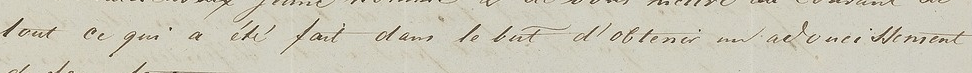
tout ce qui a été fait dans le but d'obtenir un adoucissement
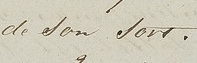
de son sort.
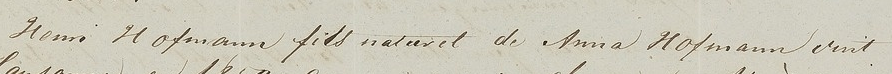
Henri Hofmann fils naturel de Anna Hofmann vint
